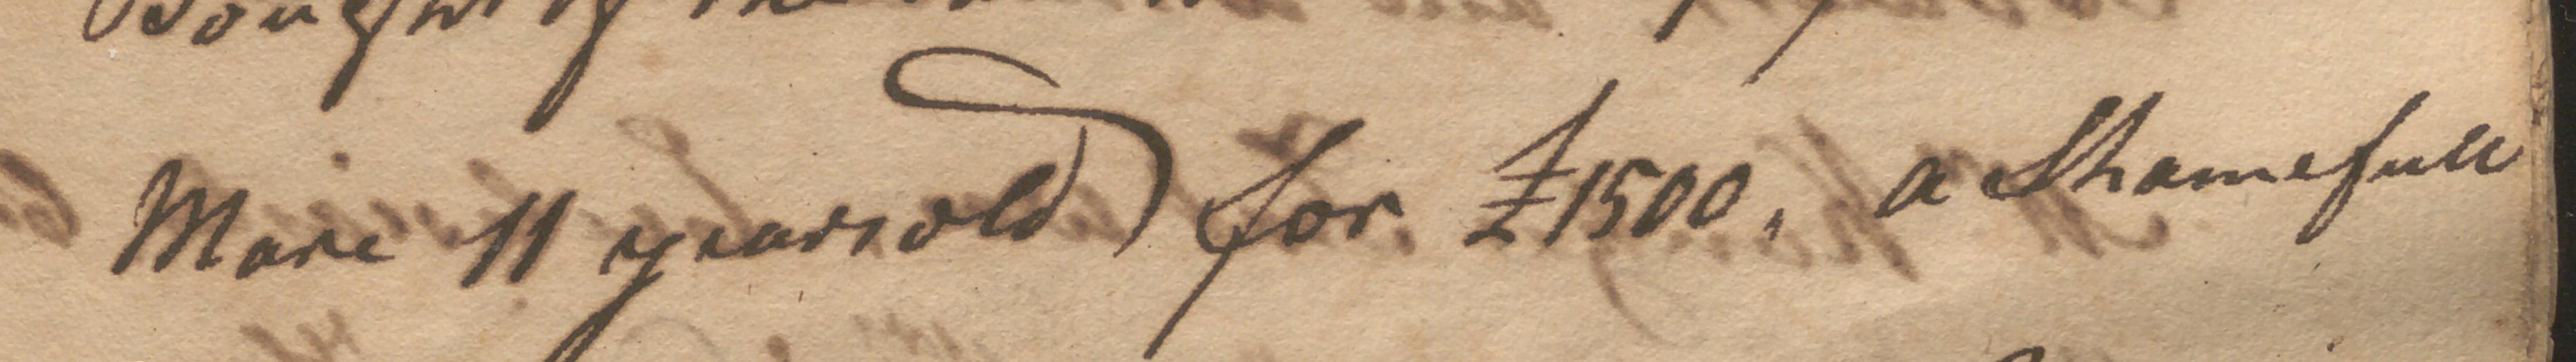Mare 11 years old for £1500, a Shamefull
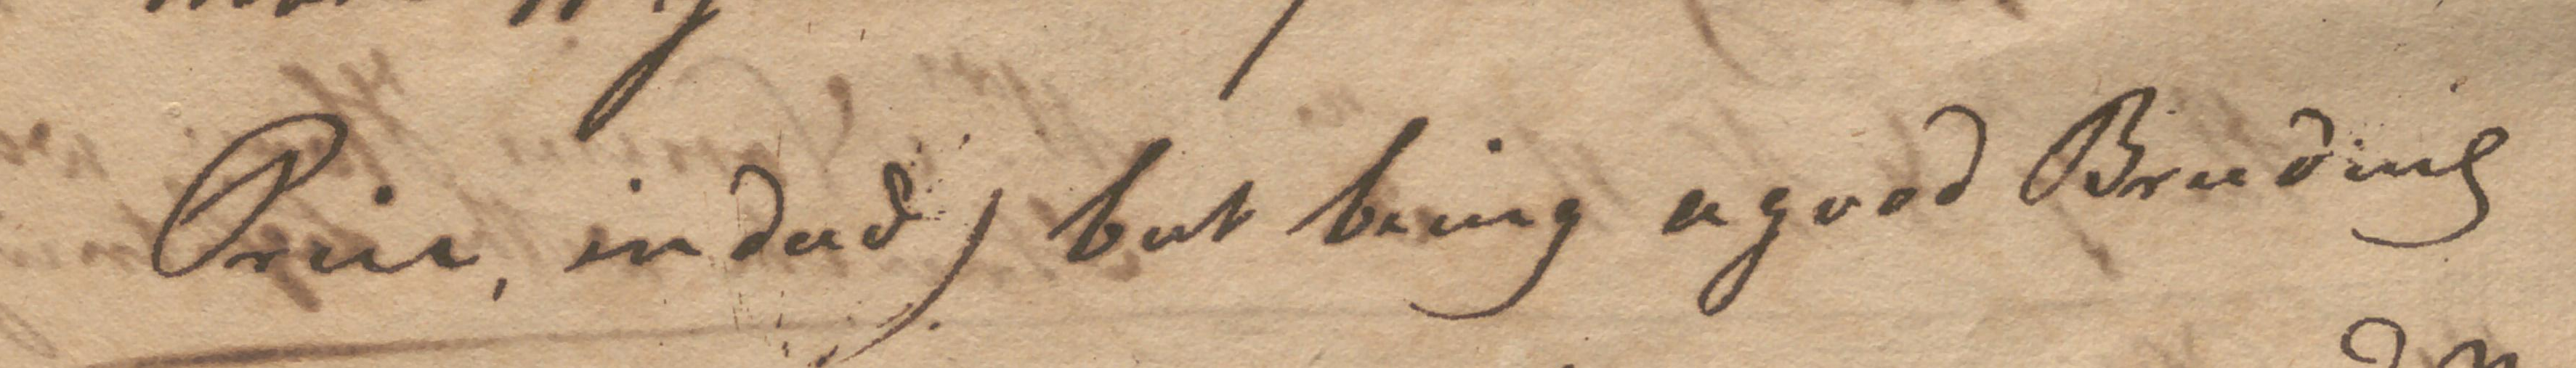Price, inded) but being a good Breeding
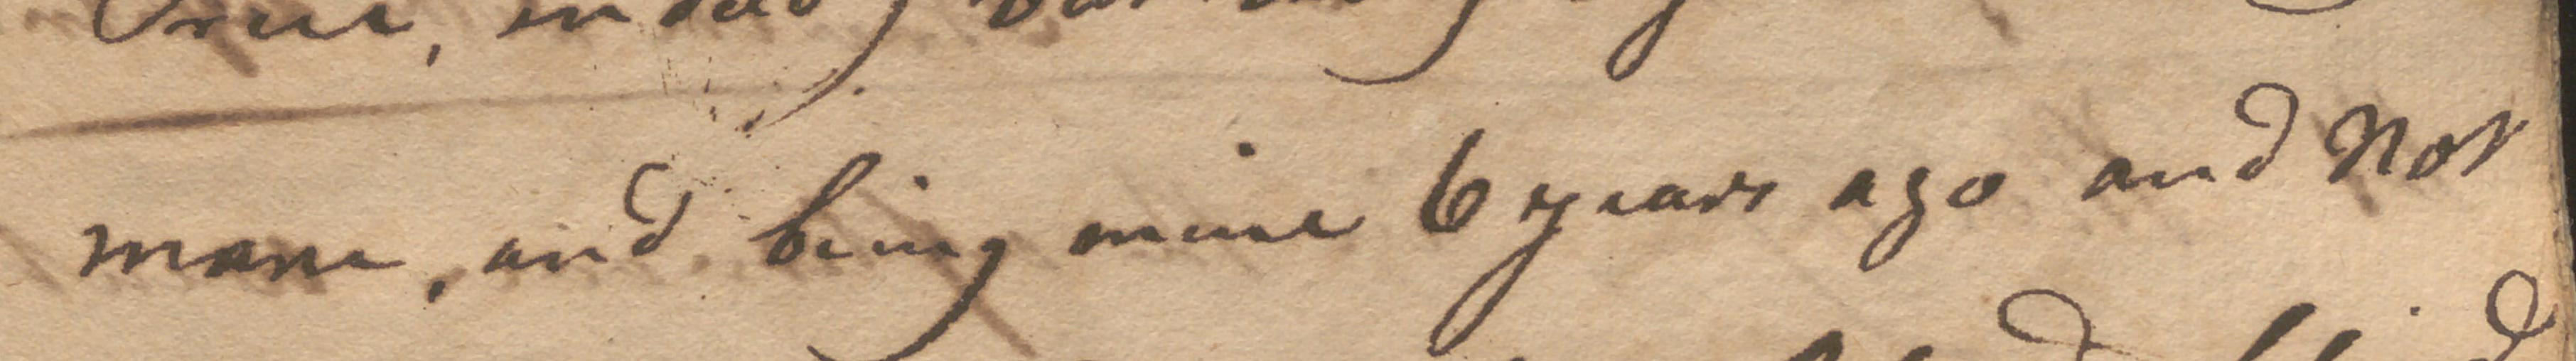mare, and being mine 6 years ago and not
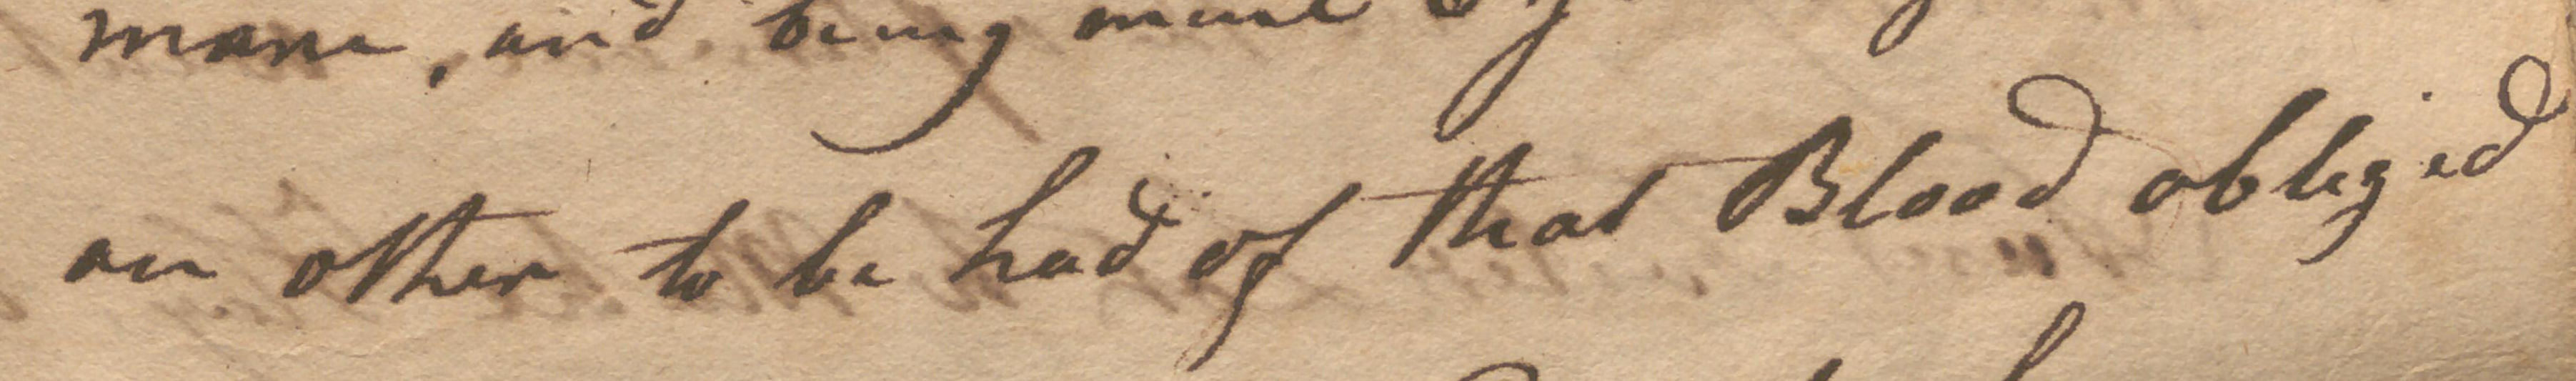an other to be had of that Blood obliged
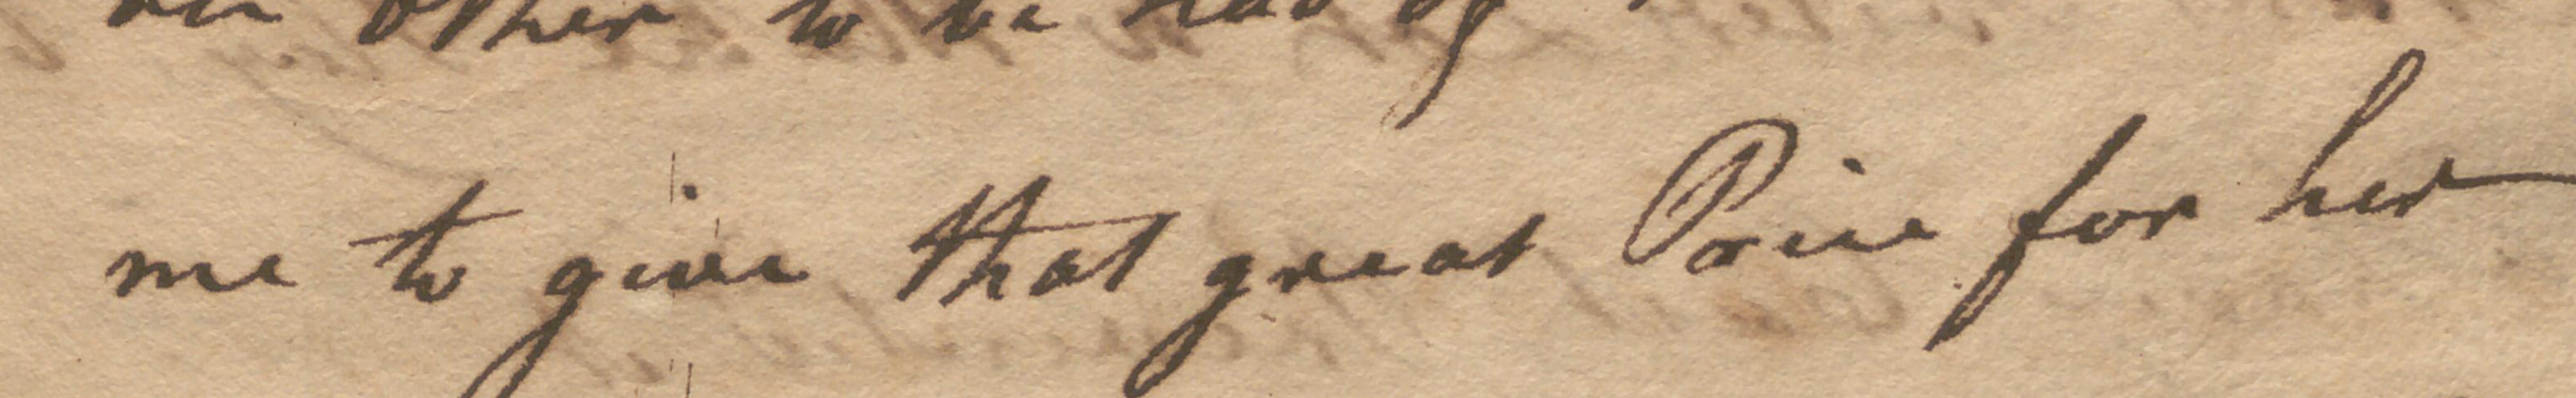me to give that great Price for her
